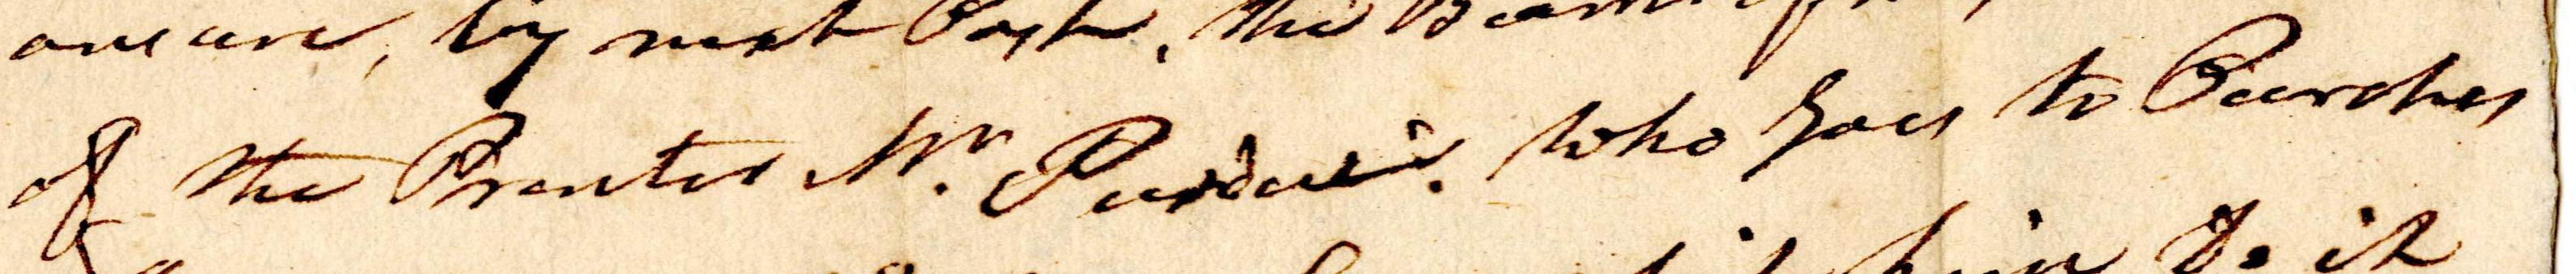of the Prenter M^rs. Purdue. who goes to Purches
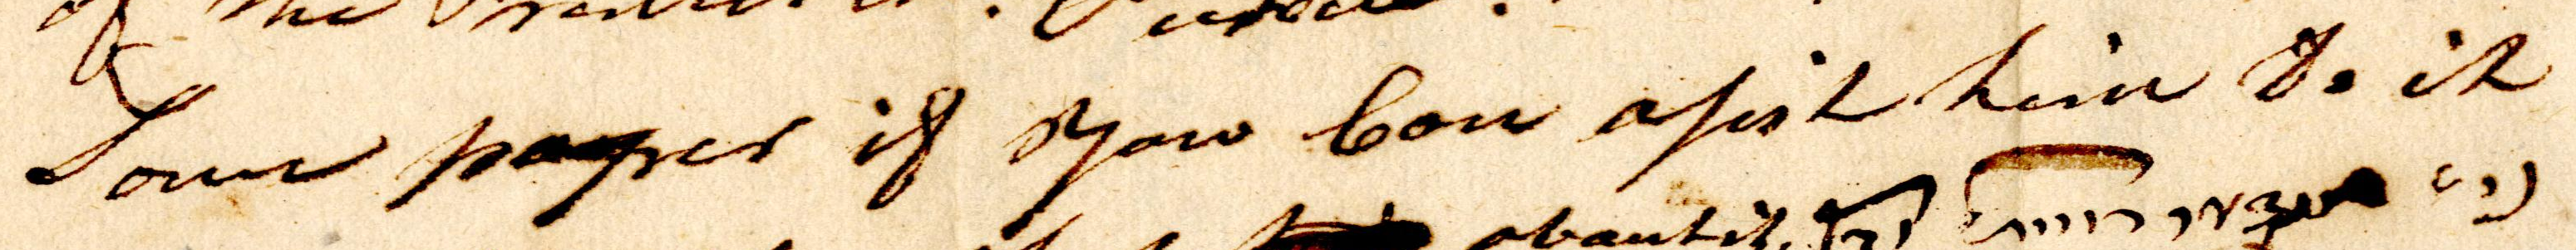some paper if you Can assist him as is
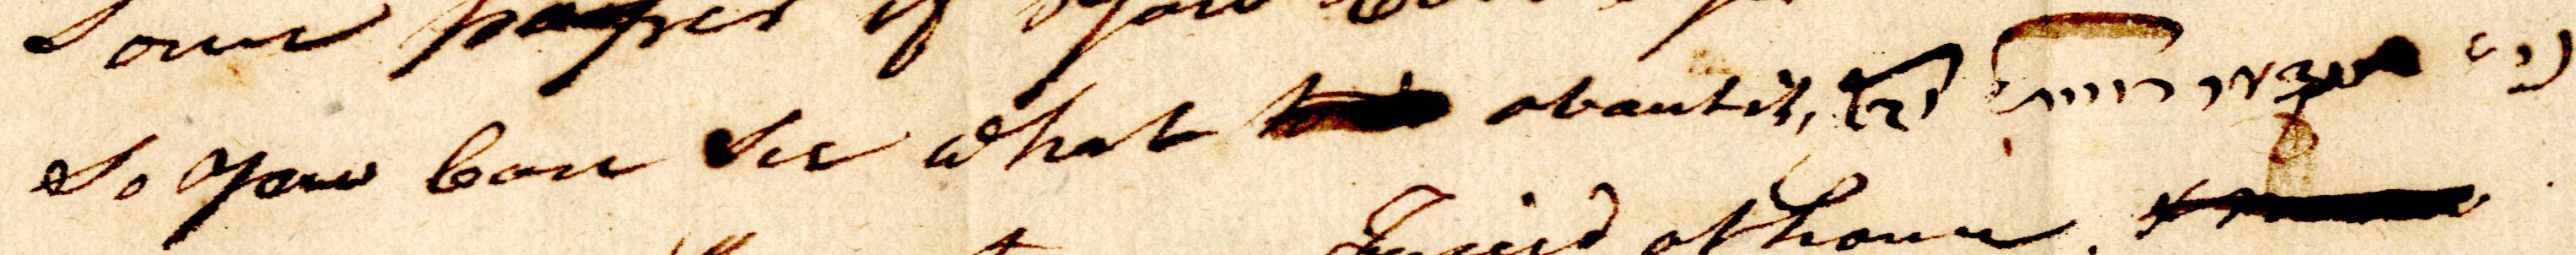So you can see what [__] about it, [__________]
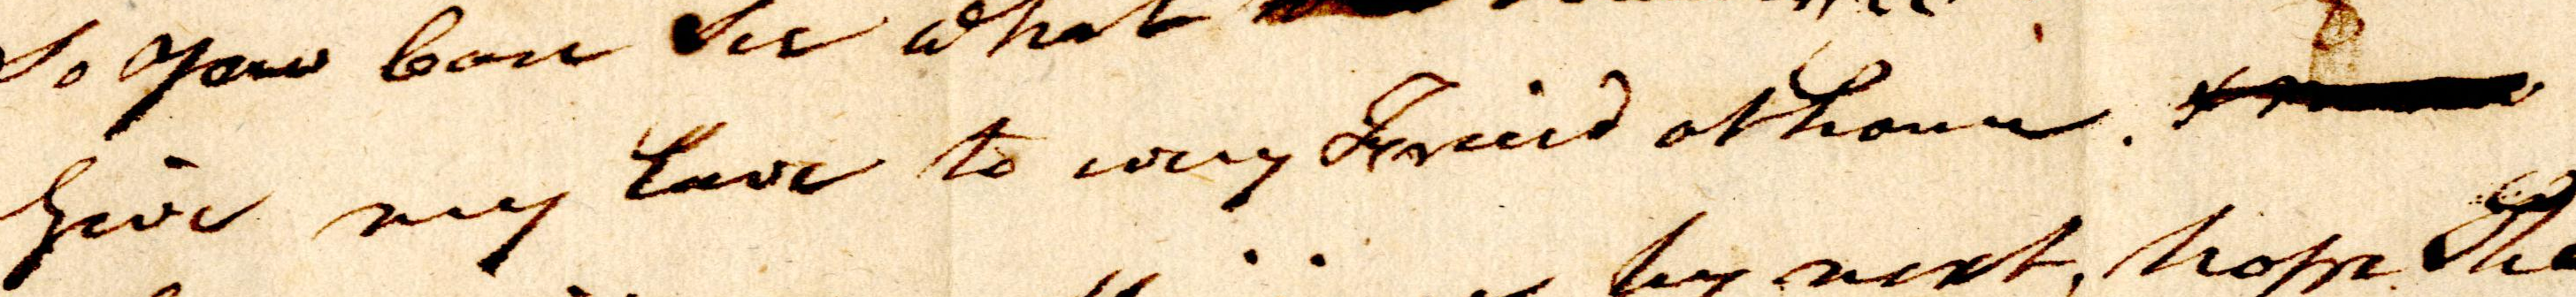Give my love to every Freeid at home, [_____]
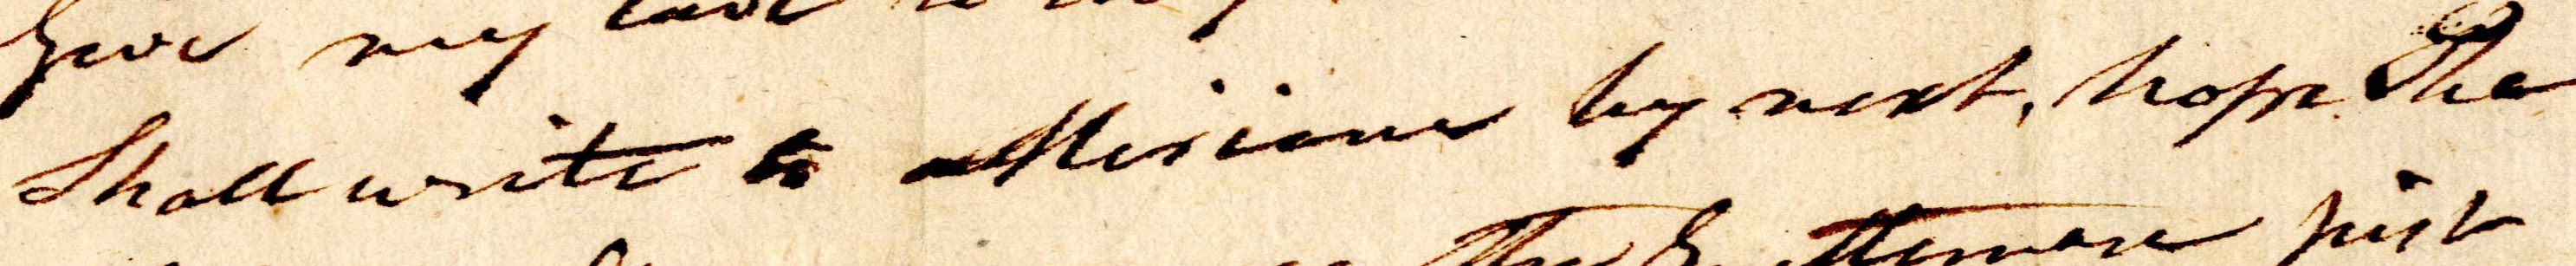shall write to Miriam by next, hope The
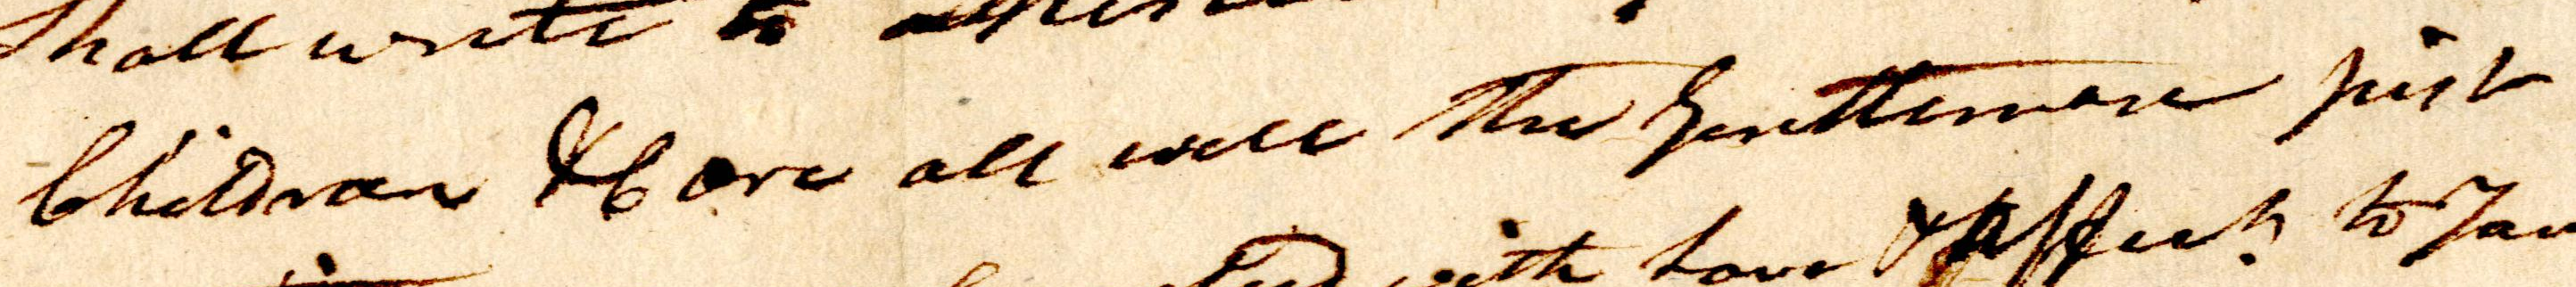Children &c are all well the Gentleman just
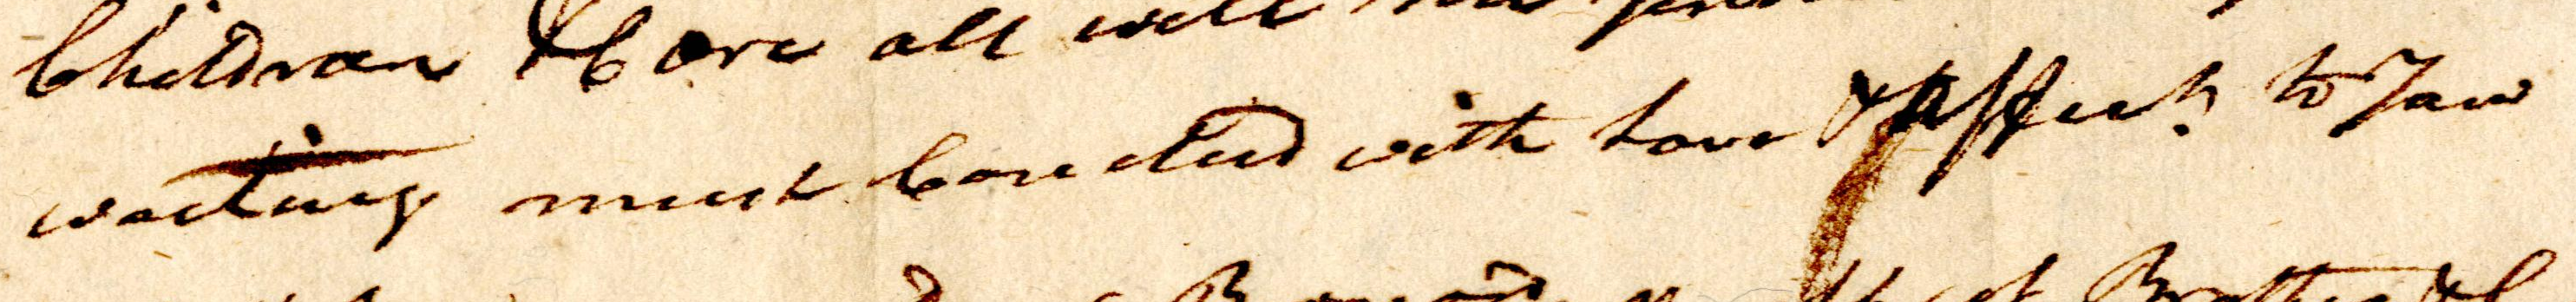waiting must Conclud with Love & affec^t. to you
